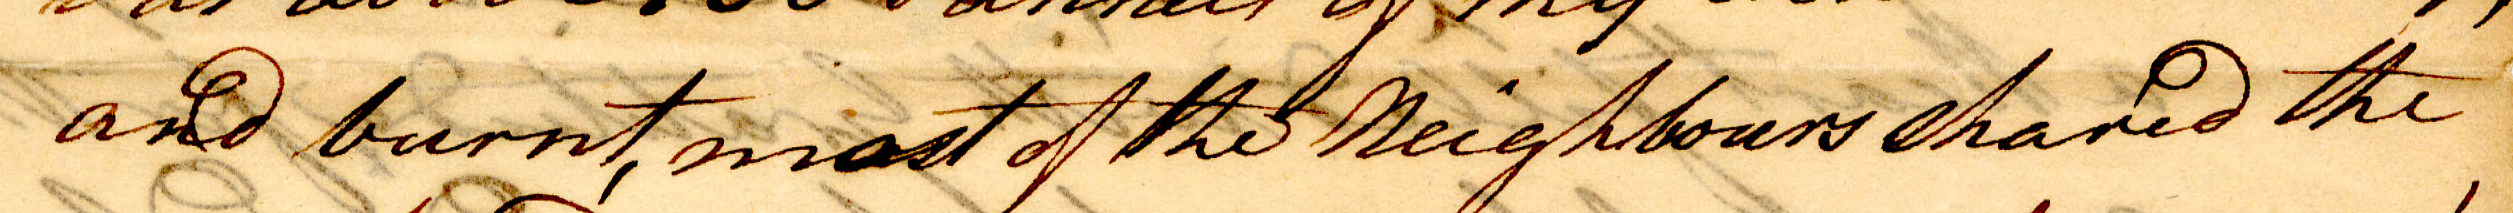and burnt, most of the Neighbours shared the
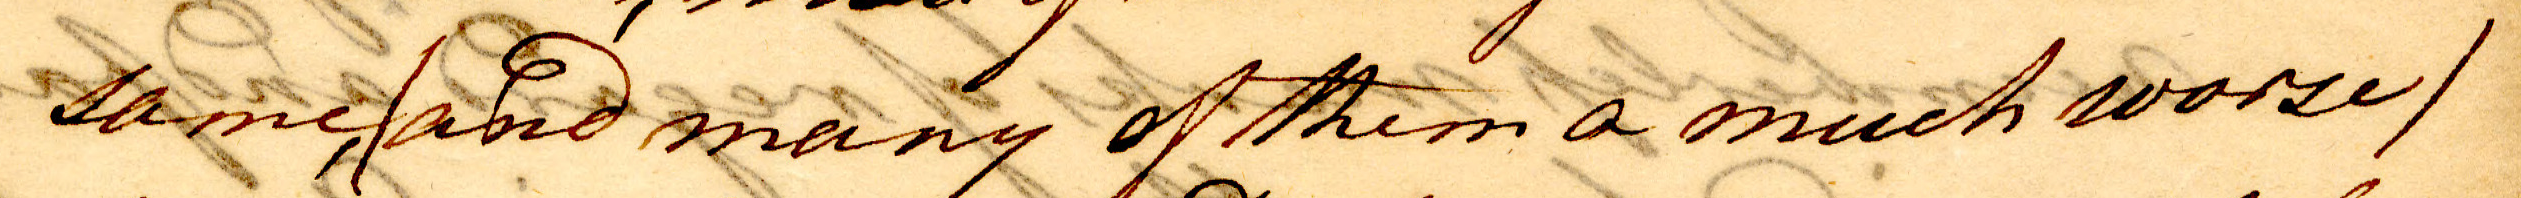same, (and many of them a much worse)
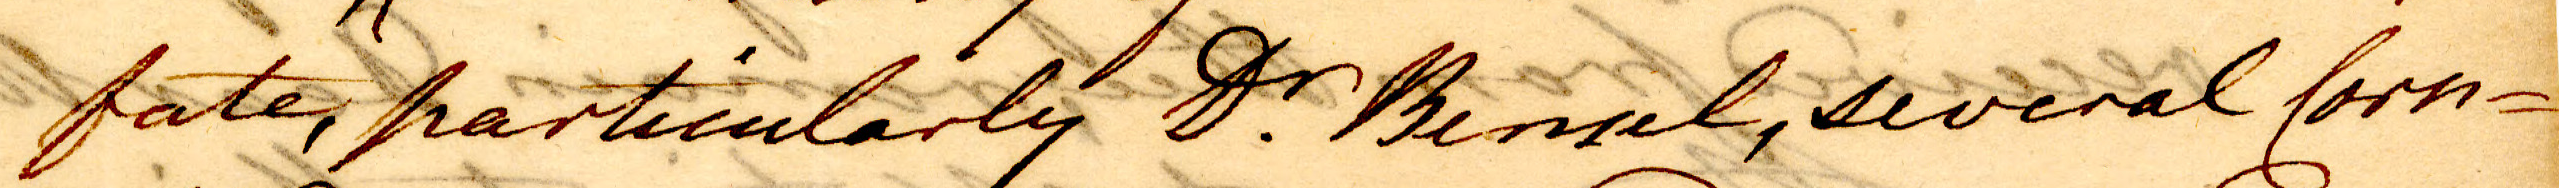fate, particularly D^r. Bensel, several Corn-
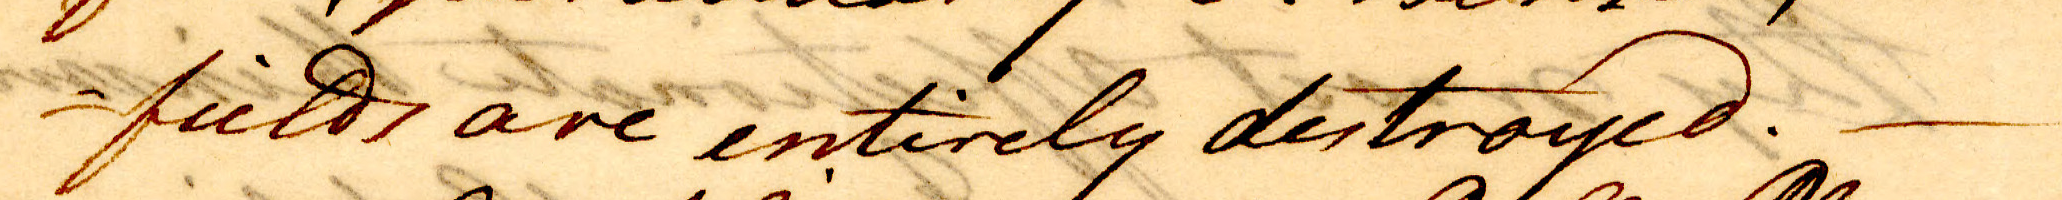-fields are entirely destroyed.-
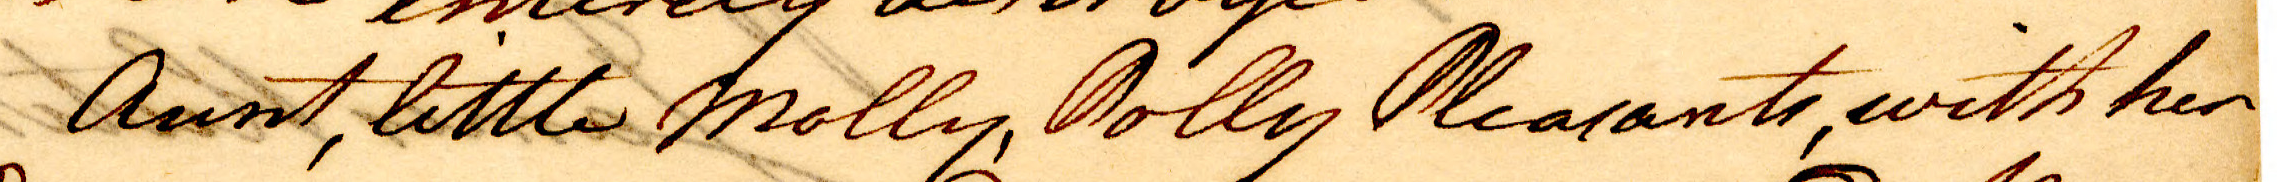Aunt, little Molly, Polly Pleasants, with her
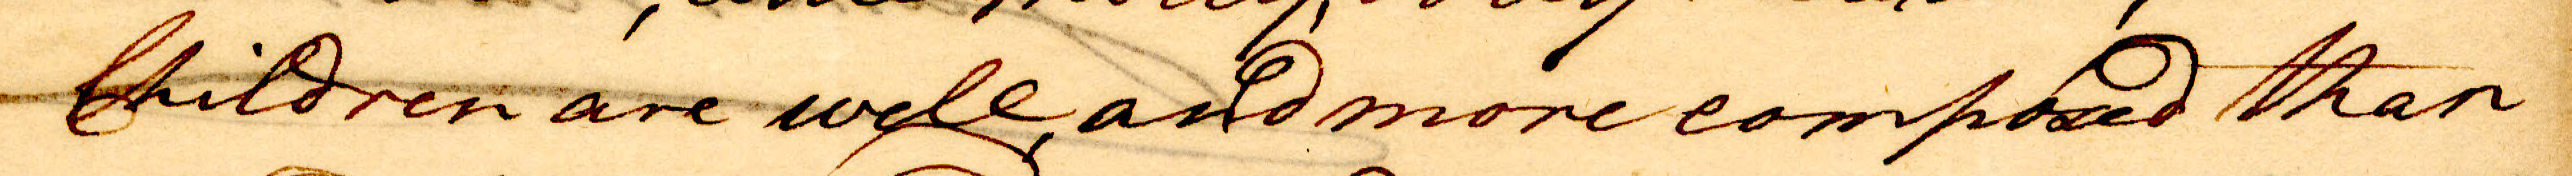Children are well, and more composed than
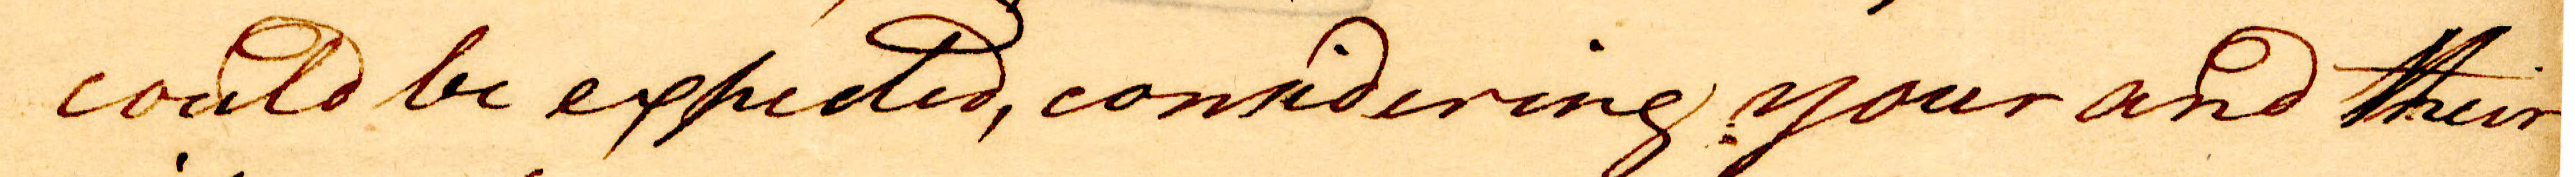could be expected, considering your and their
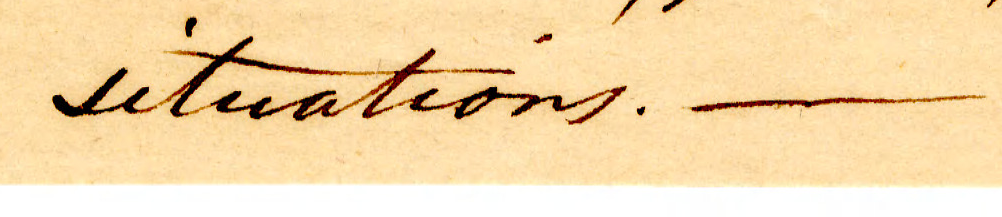situations.-
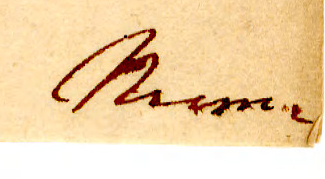Num
